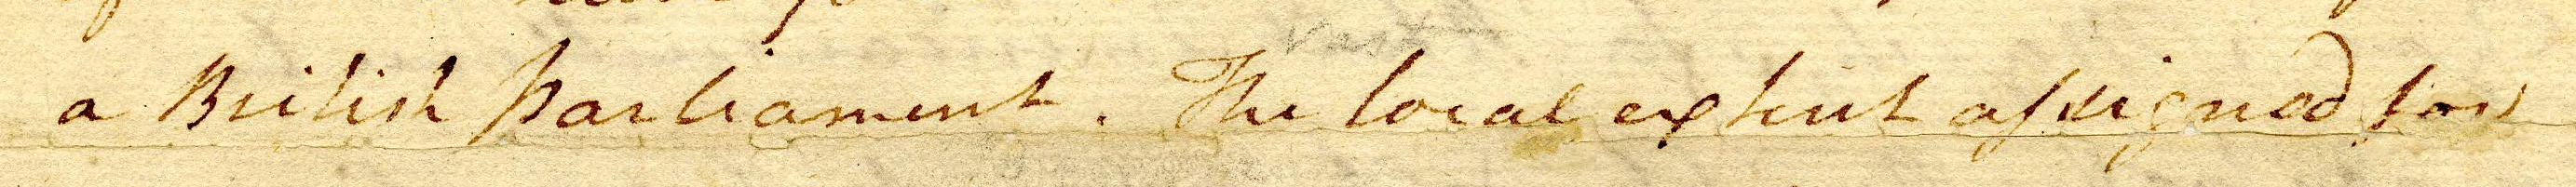a British parliament. The local extent assigned for
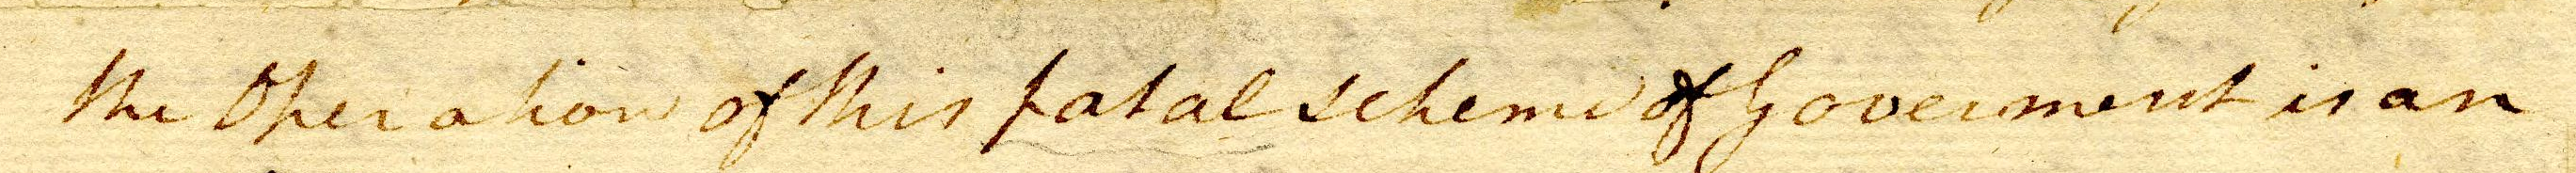the Operation of this fatal scheme of Goverment is an
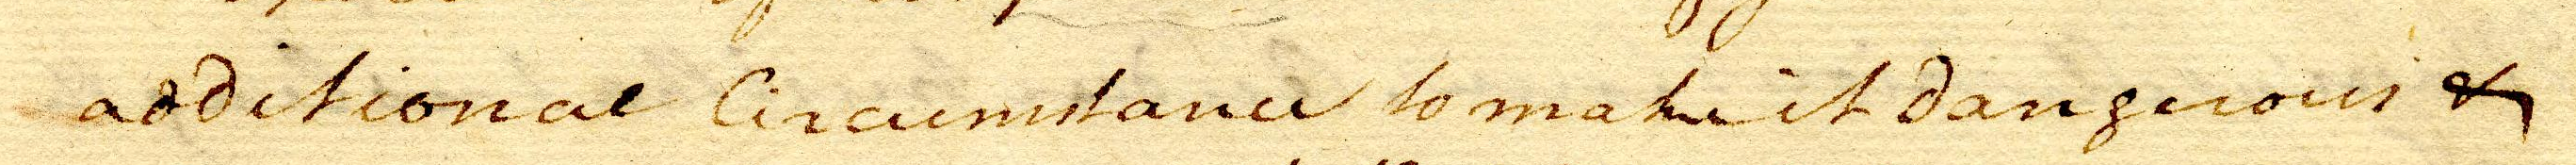additional circumstance to make it dangerous &
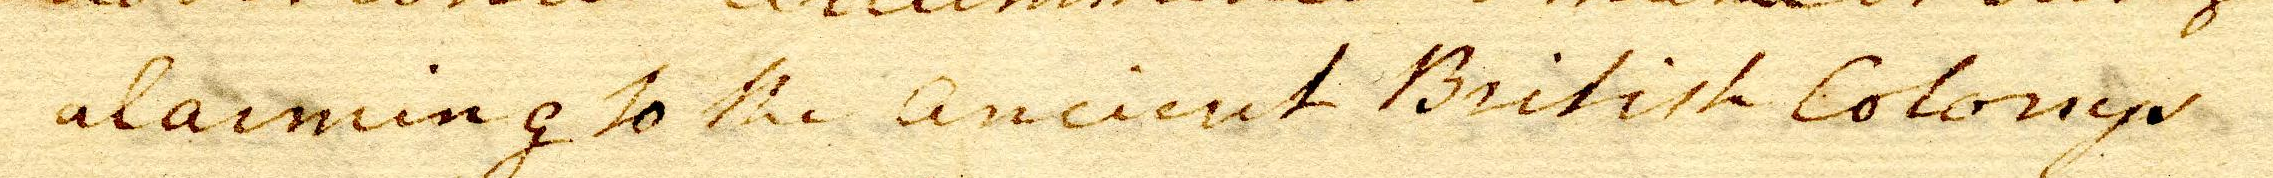alarming to the Ancient British Colonys
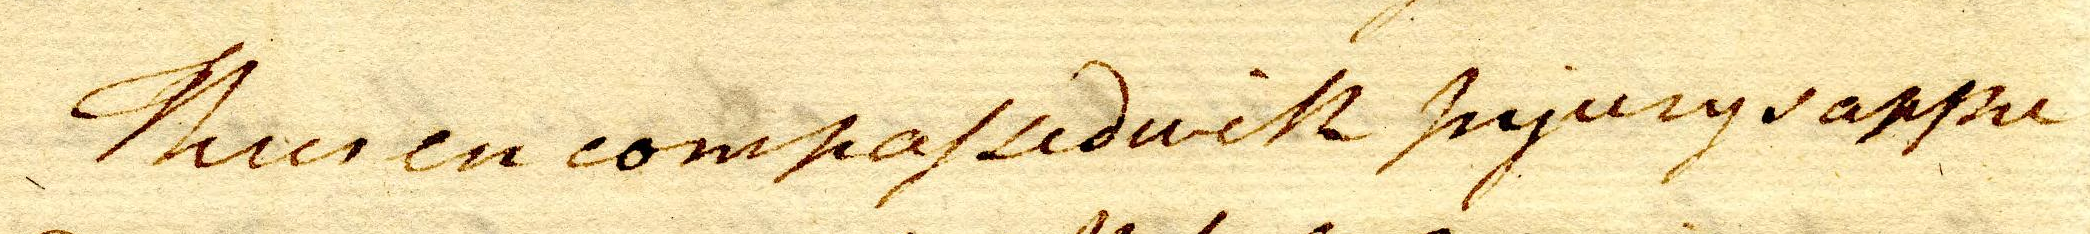These encompassed with Injurys appre
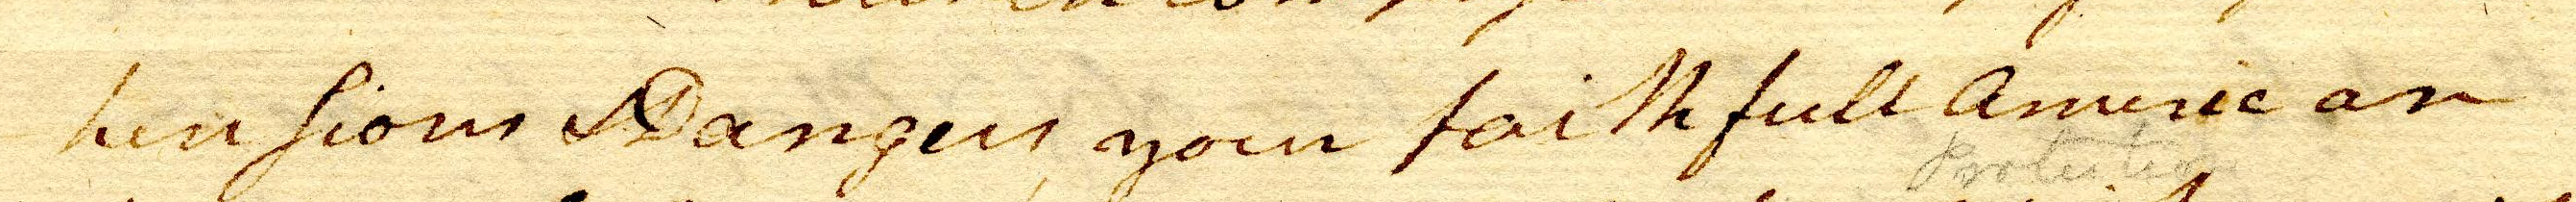hensions Dangers your faithfull American
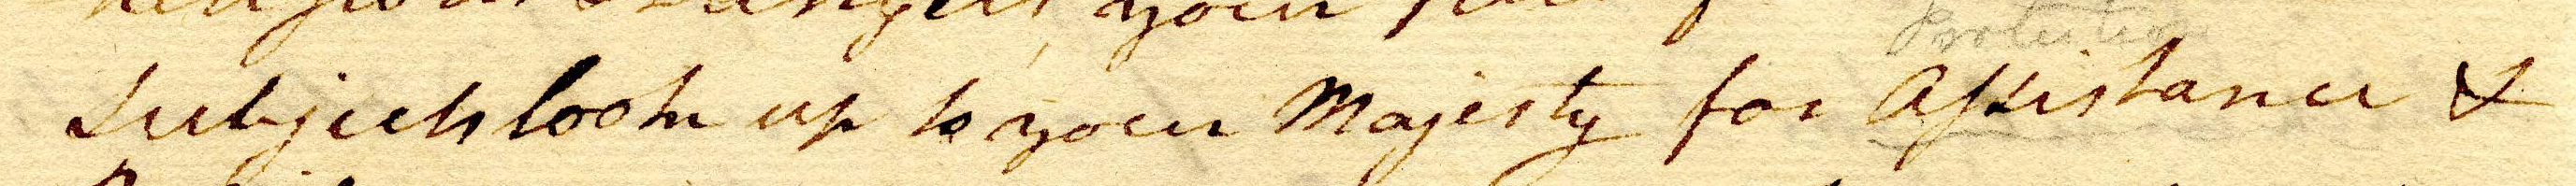subjects look up to your Majesty for Assistance &
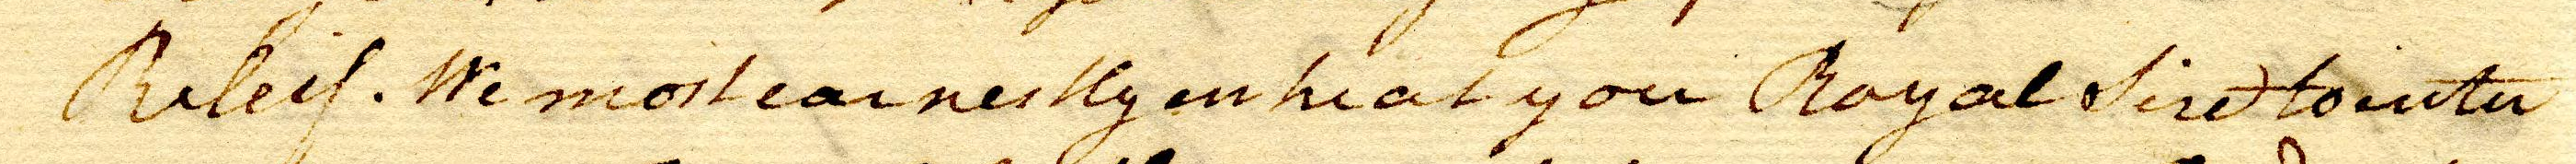Releif. We most earnestly entreat you Royal Sire to inter
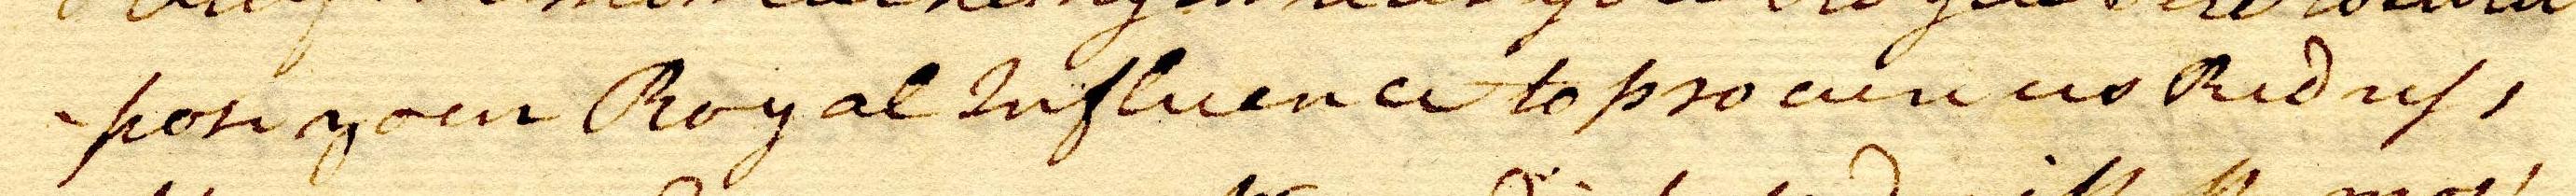-pon your Royal Influence to procure us Redress
